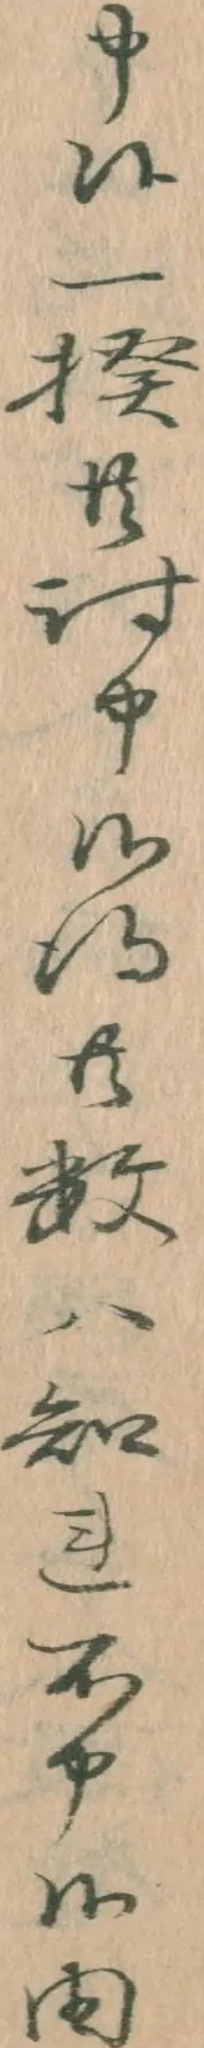申候一揆共討申候得共数は知れ不申候由
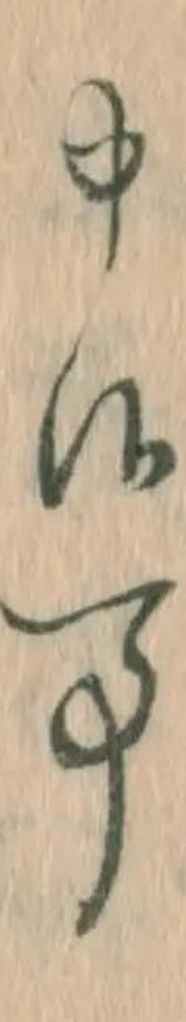申候事
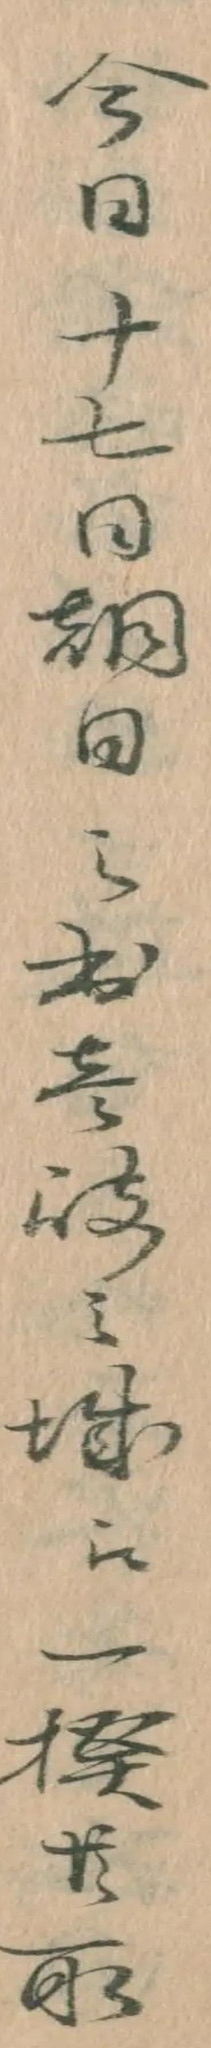一今日十七日朝日之出壱岐之城江一揆共取
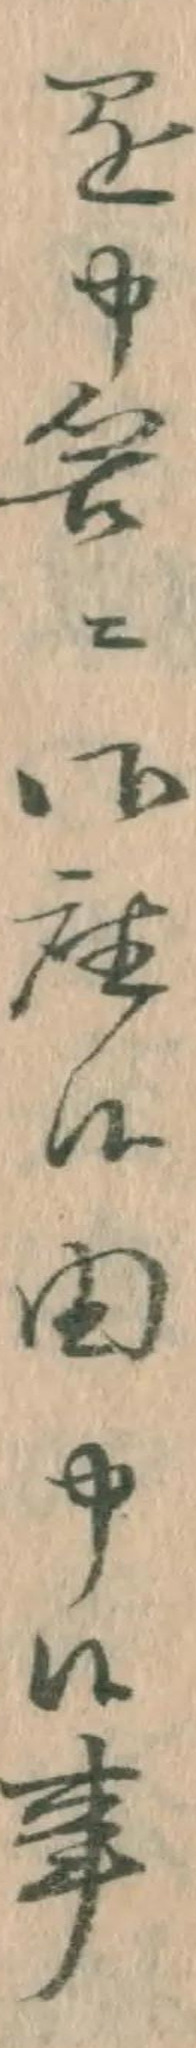懸申筈に御座候由申候事
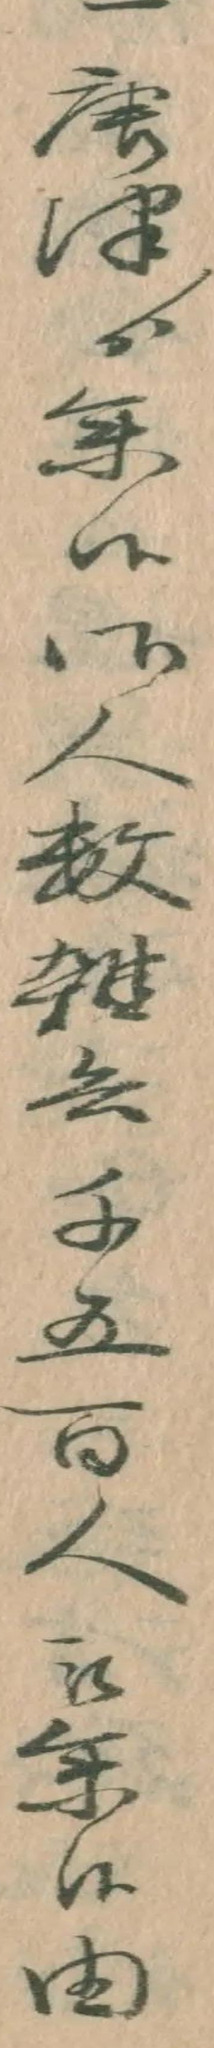一唐津ゟ参候御人数雑兵千五百人被参候由
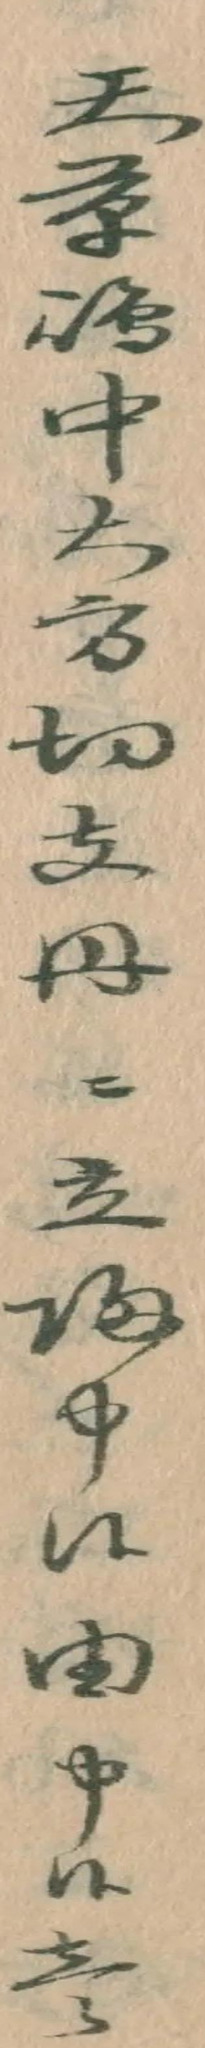一天草島中大方切支丹に立帰申候由申候壱
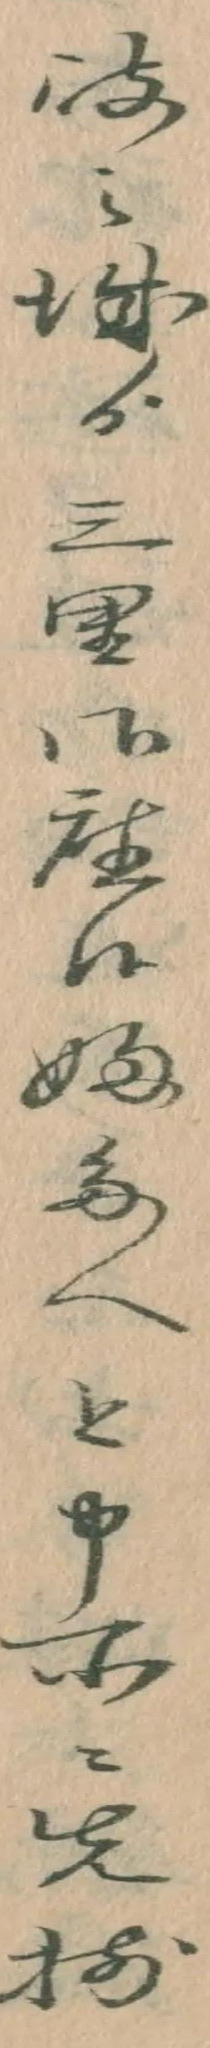岐之城ゟ三里御座候ふたへと申所に先揃
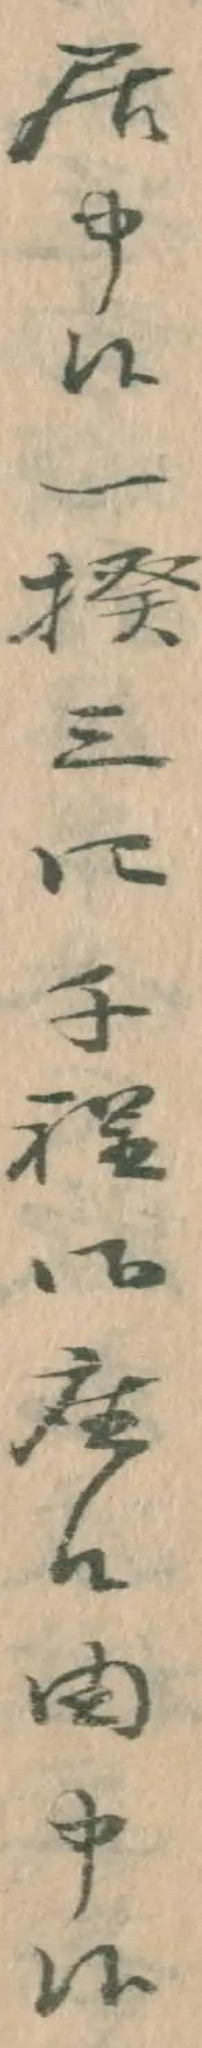居申候一揆三四千程御座候由申候
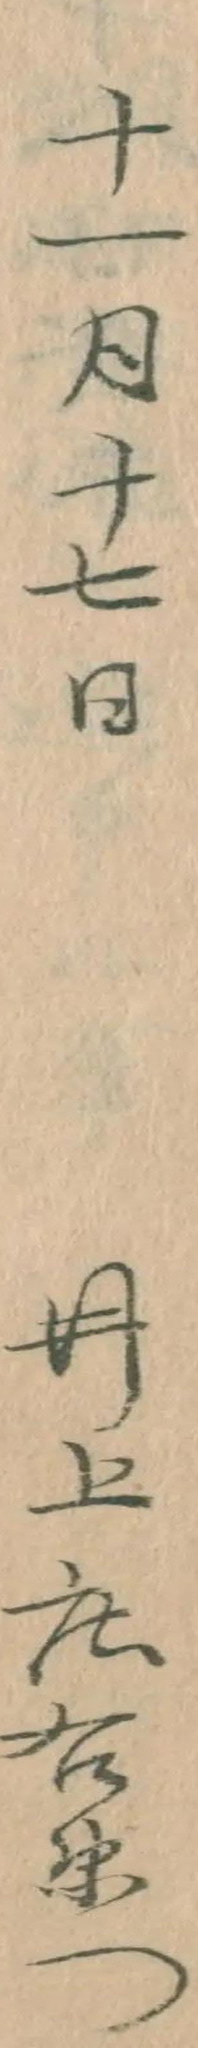十一月十七日井上庄右衛門

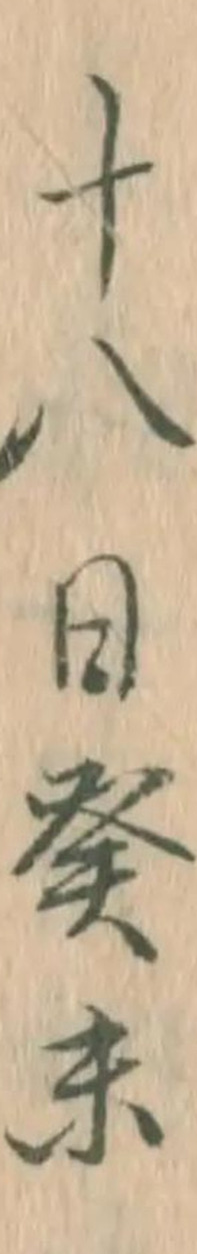十八日癸未
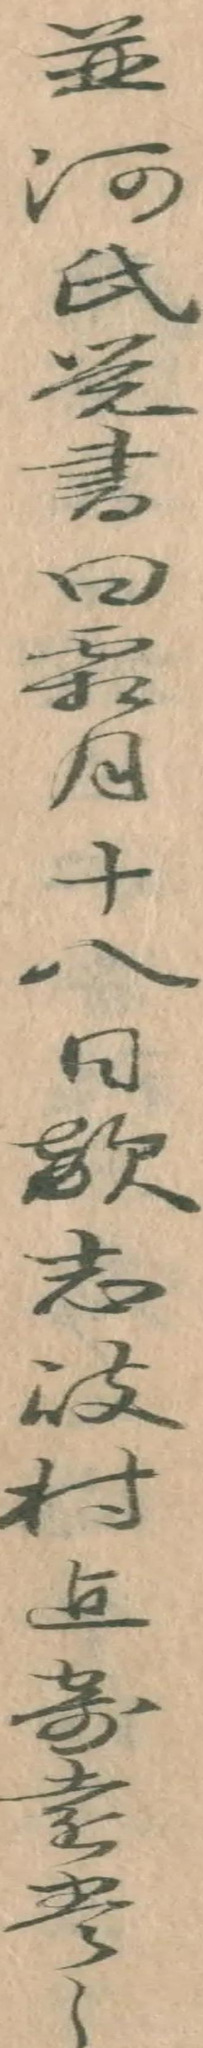並河氏覚書曰霜月十八日敵志岐村迄寄遠巻し
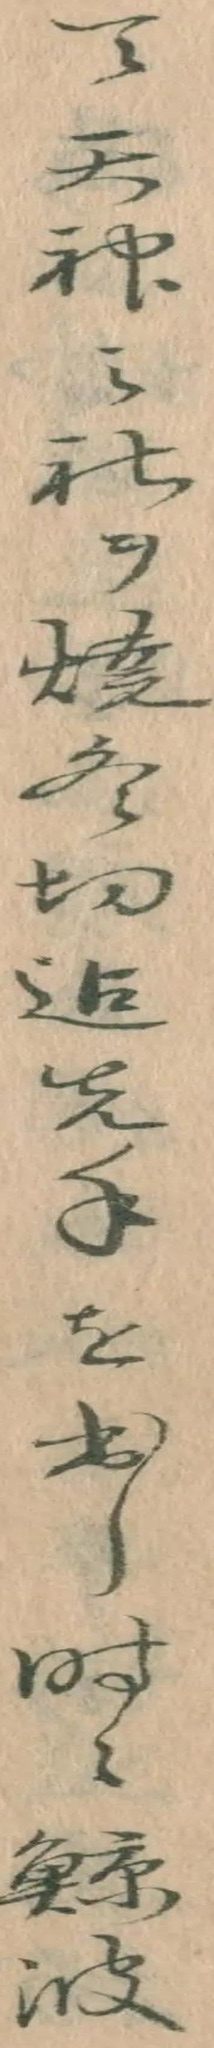て天神之社ヲ焼冬切迄先手を出し時々鯨波
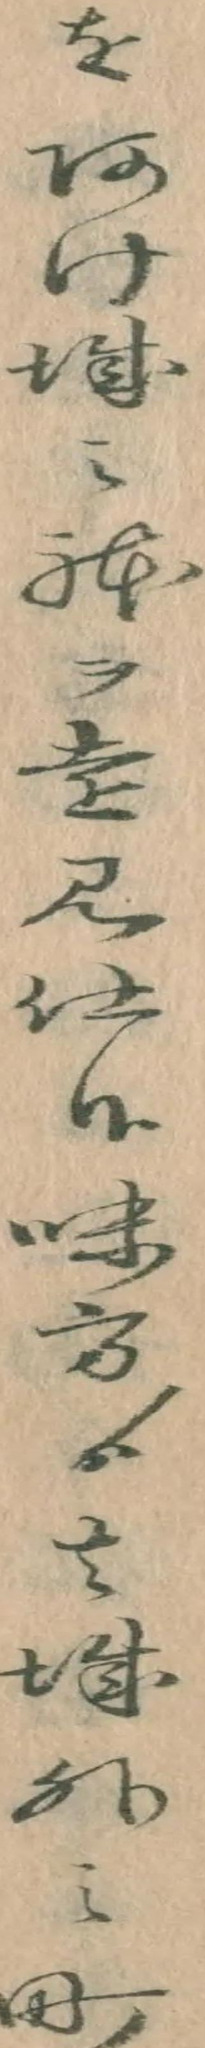をあけ城之体ヲ遠見仕候味方ゟは城外之町
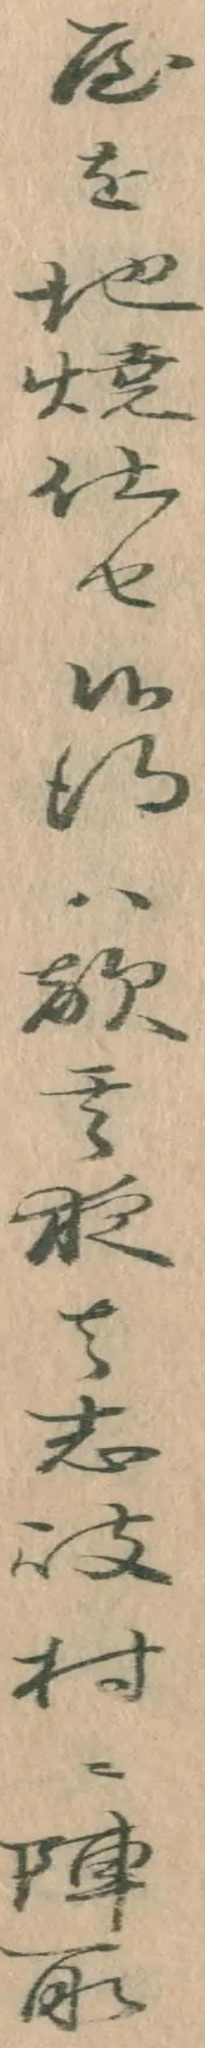屋を地焼仕セ候得は敵其夜は志岐村に陣取
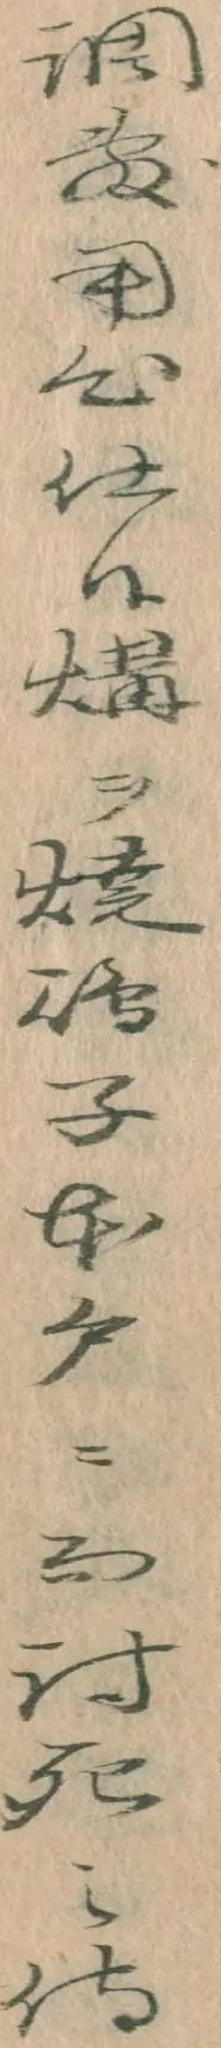調敷用心仕候煹ヲ焼島子本戸に而討死之侍
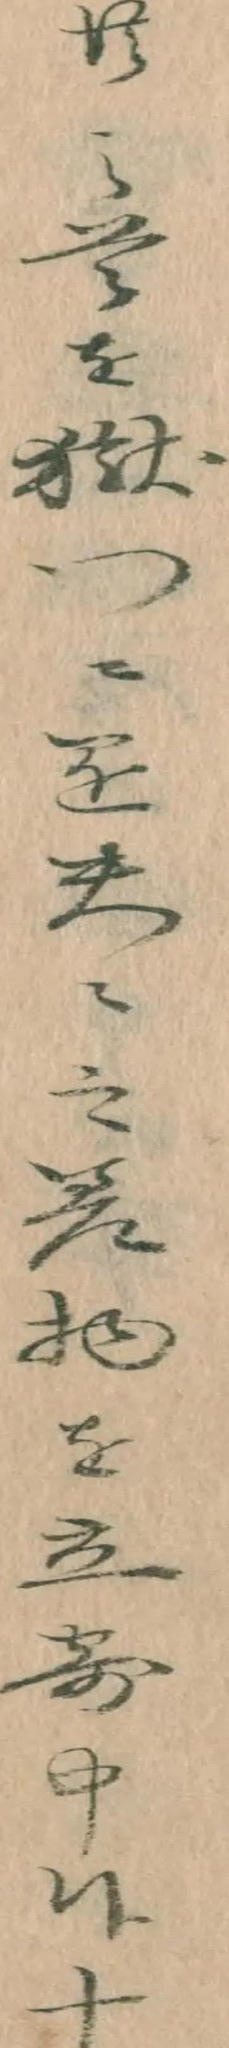共之首を獄門に懸夫々之差物を立寄申候十
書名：切支丹御退治記 49巻. [3]
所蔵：国立国会図書館 National Diet Library, JAPAN
